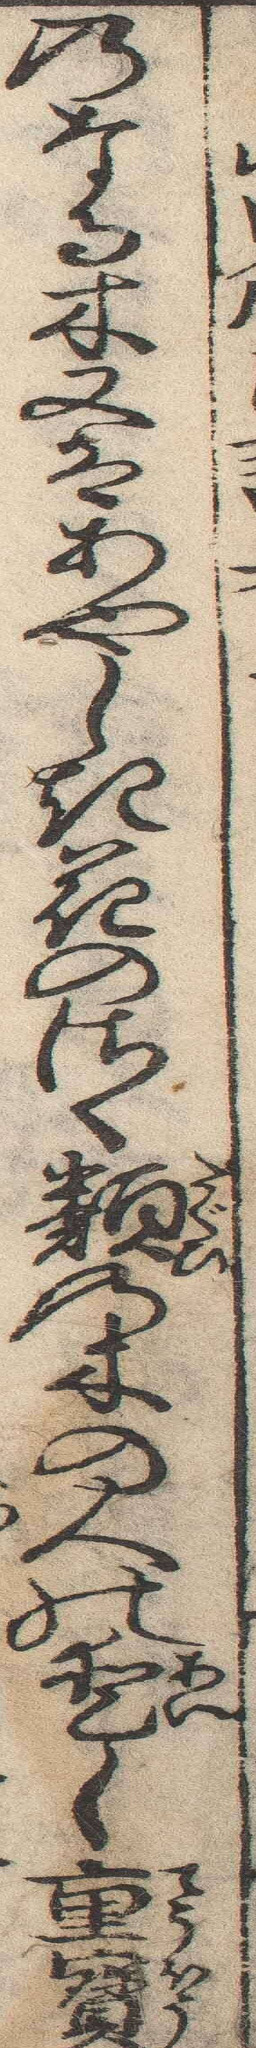のなる木又はあやしき花のつく類の木の人の愛し重寳
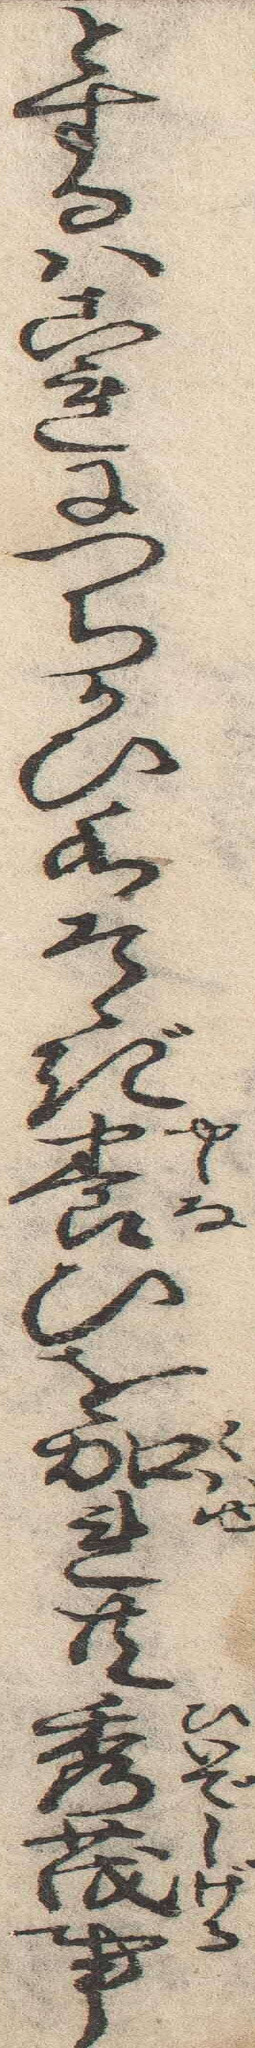とするはこれにつちかひ水そゝぎ養ひを加れ共秀茂事
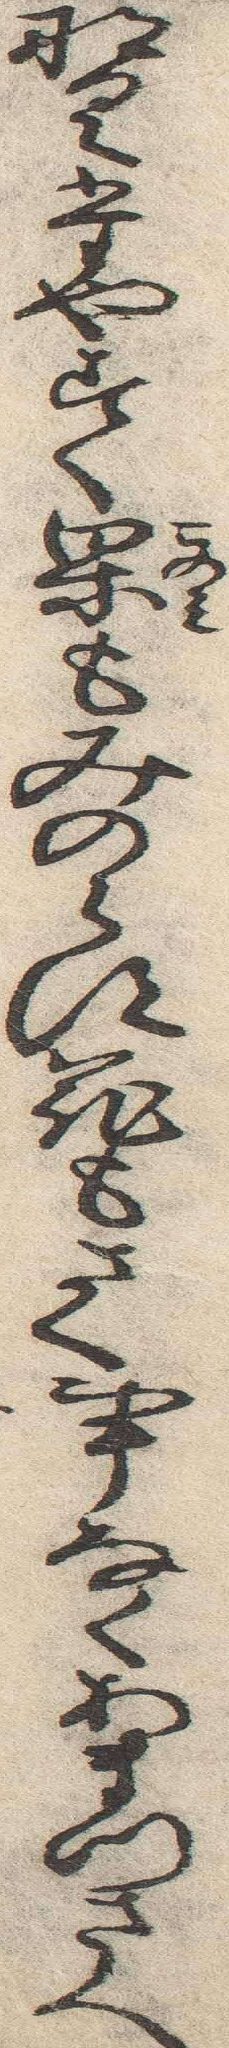なくたやすく果もみのらす花もさく事なくあまつさへ
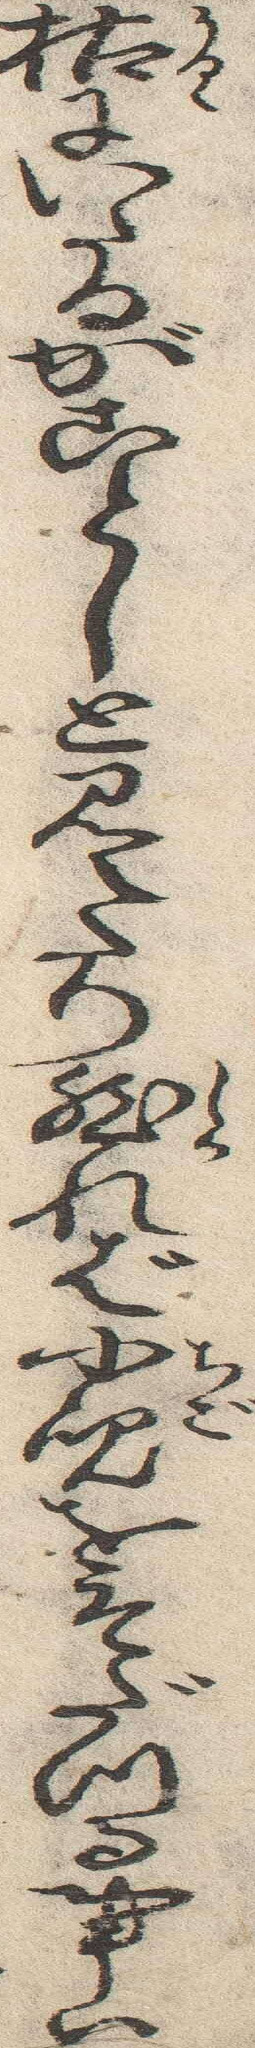枯にいたるがことしと見えたり然れば小児をそだつる事は
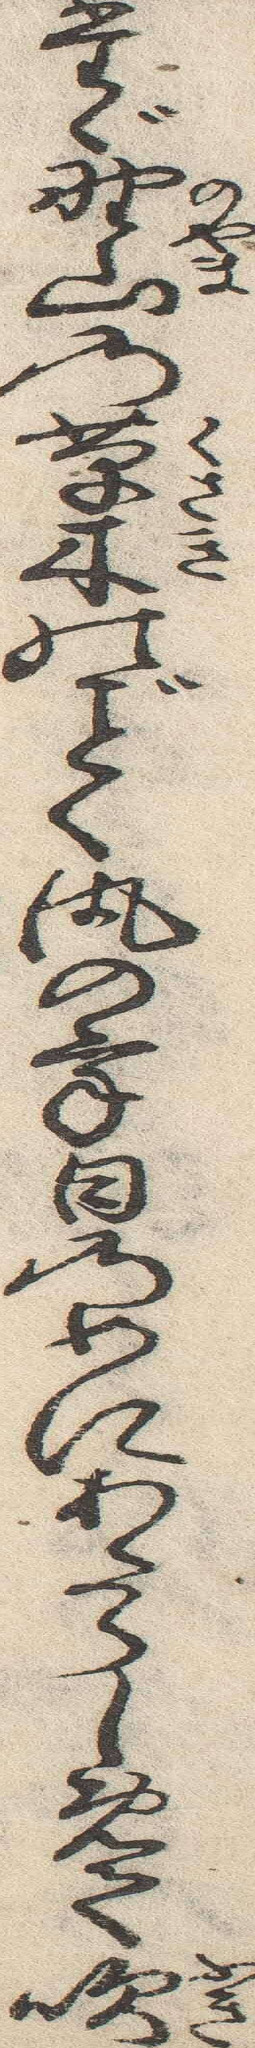たゞ野山の草木のごとく風の氣日のめにあたらしめて吹
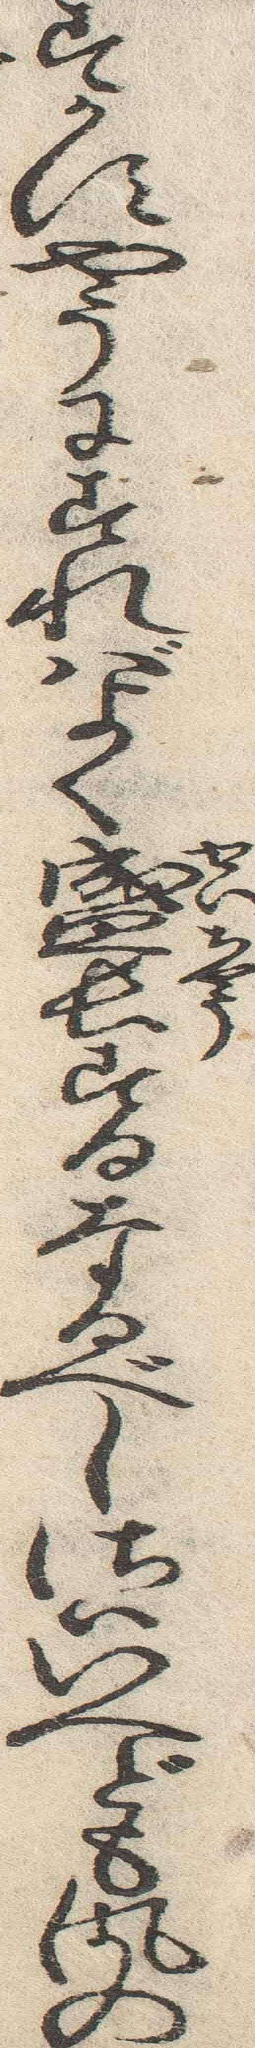すかすやうにすればよく盛長するなるべしさはいへども風の
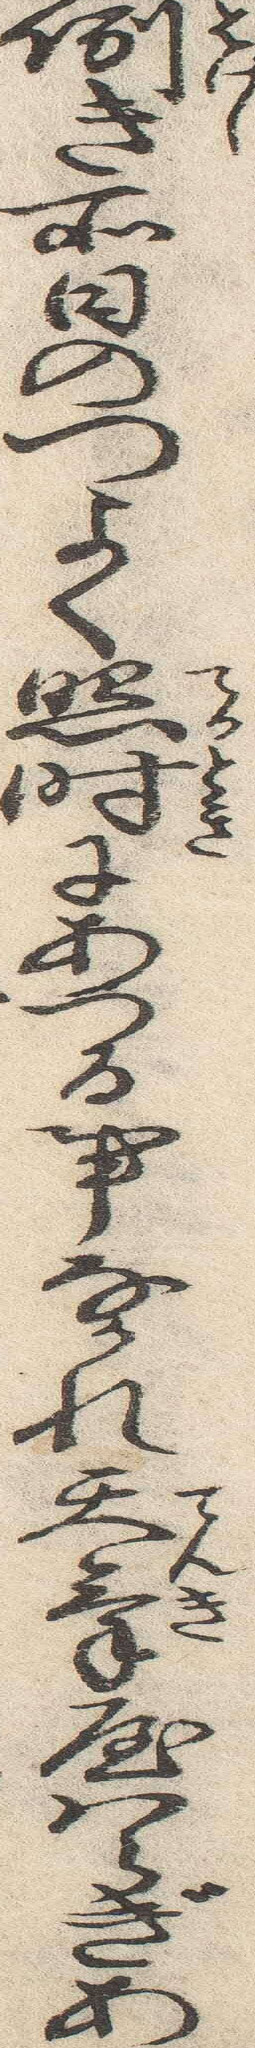烈き所日のつよく照時にあつる事なかれ天氣やはらぎあ
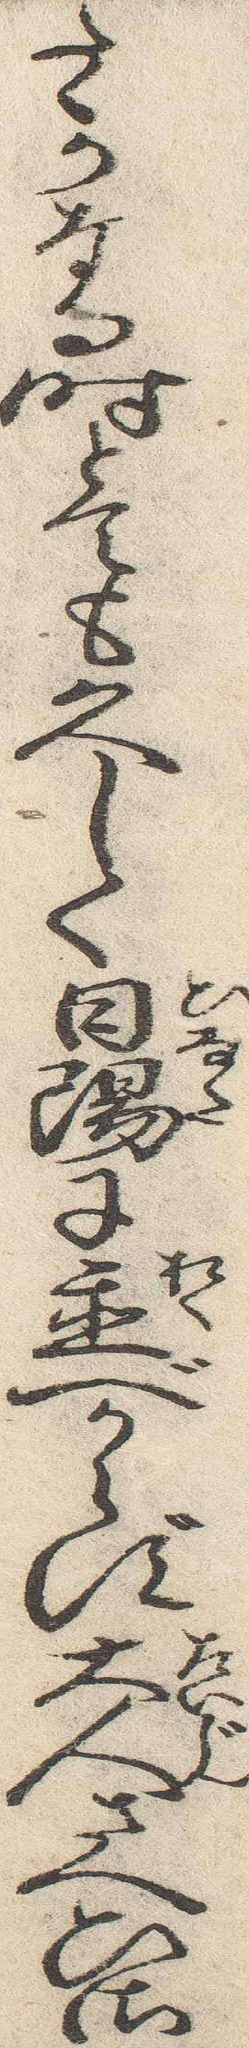たゝかなる時とても久しく日陽に置べからず大人さへひさ
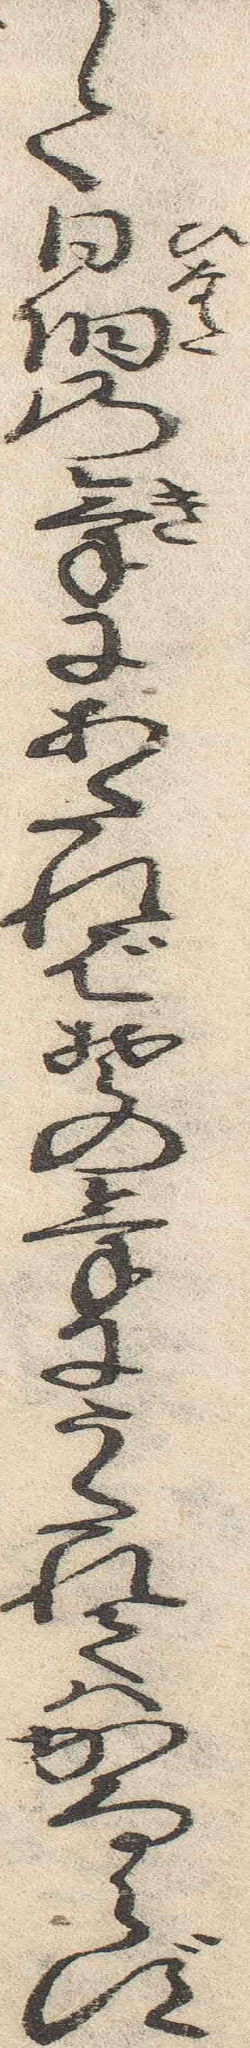しく日向の氣にあたればその氣にうたれてはかならず
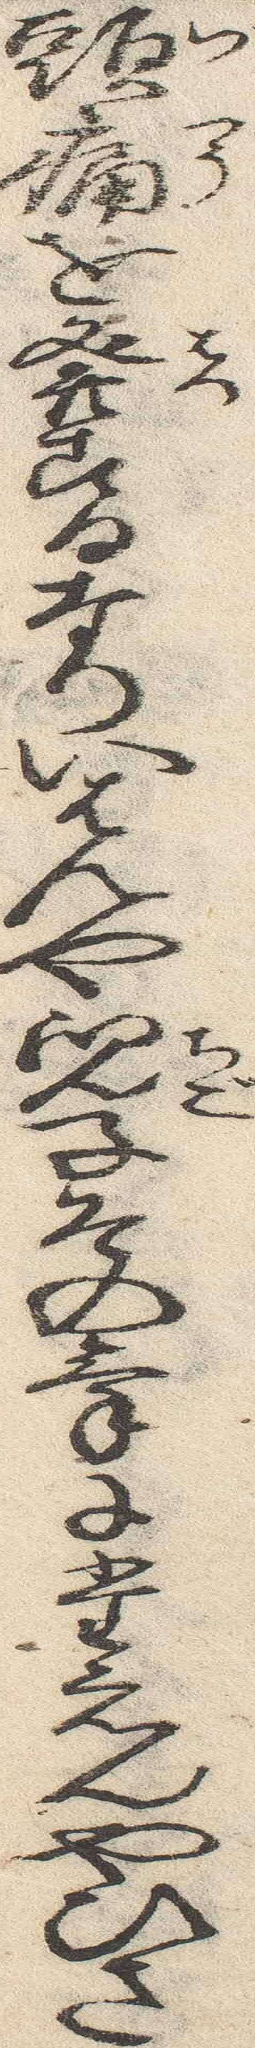頭痛を発するなりいはんや児子その氣にたえんやひさ
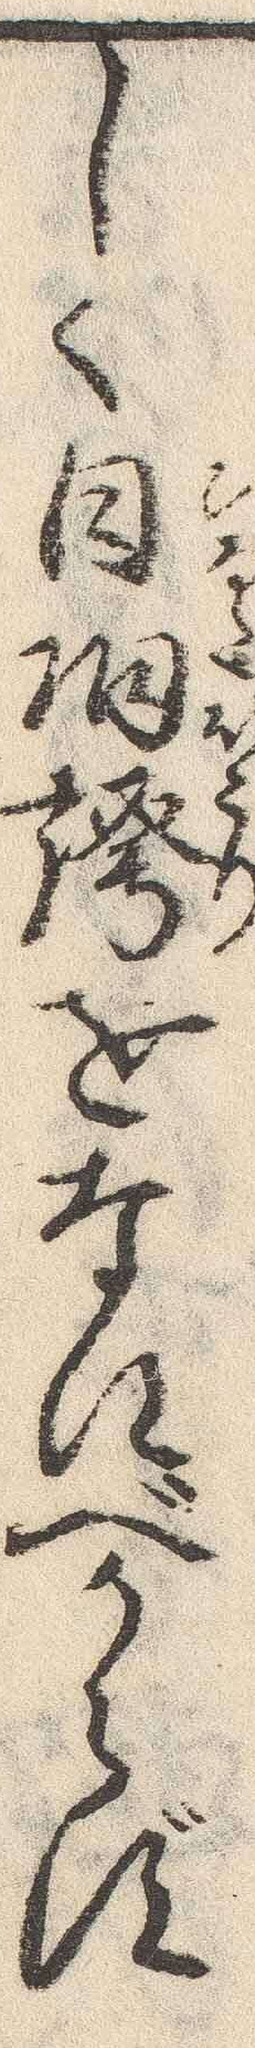しく日向誇をなすべからず
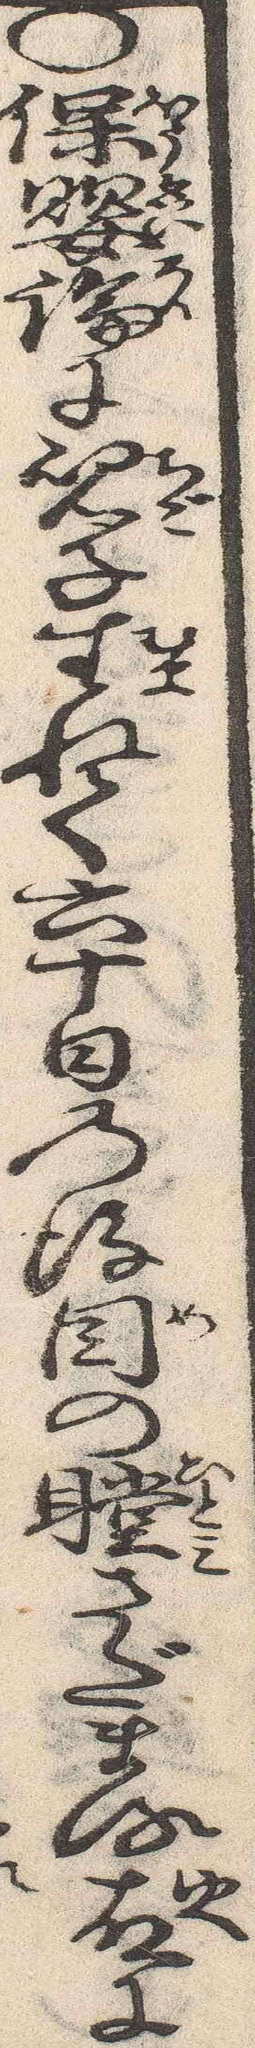○保嬰論に児子生れて六十日の頃目の瞠さだまる故に
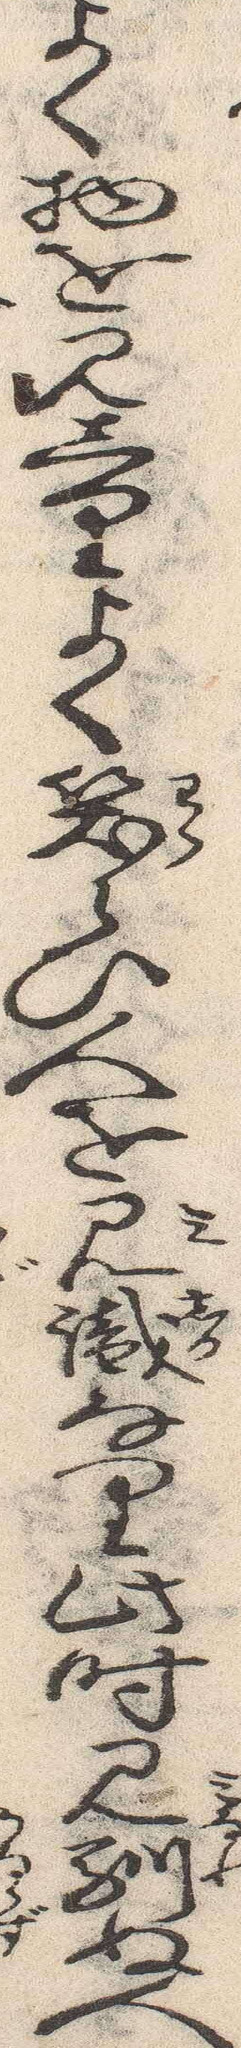よく物を見しりよく笑らひ人を見識なり此時見馴ぬ人
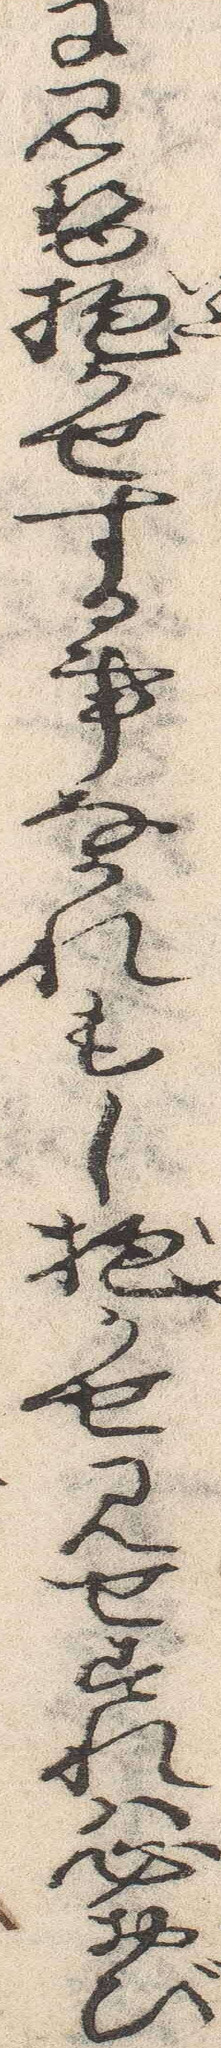に見せ抱かせする事なかれもし抱かせ見せすれは必おび
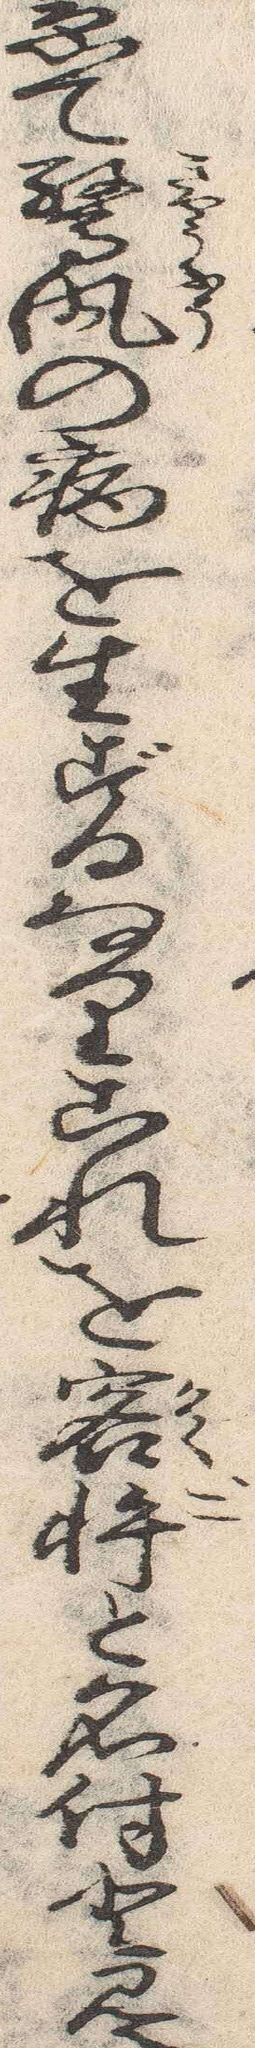ゑて驚風の病を生ずるなりこれを客忤と名付と見え
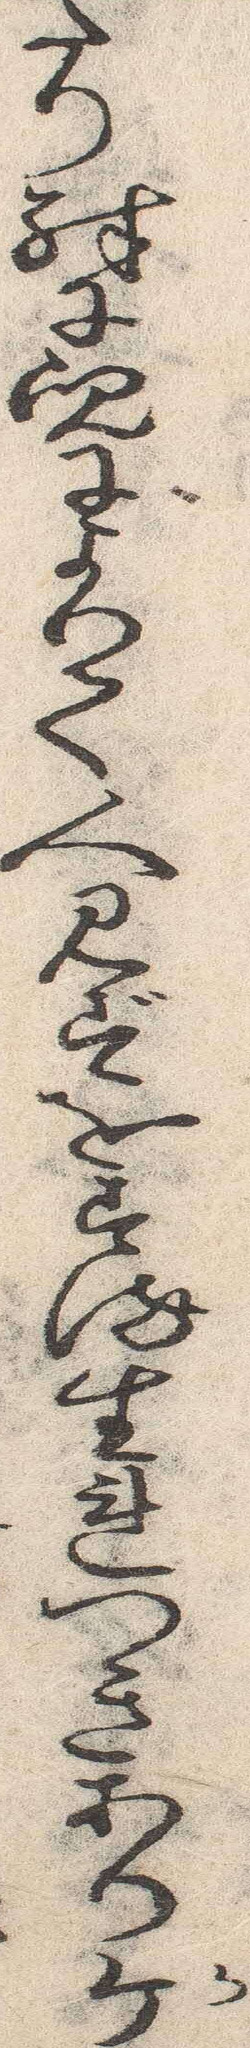たり殊に児によりて人見ずをする生れつきありケ
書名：小児必用養育草
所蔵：東京学芸大学附属図書館 国文学研究資料館
